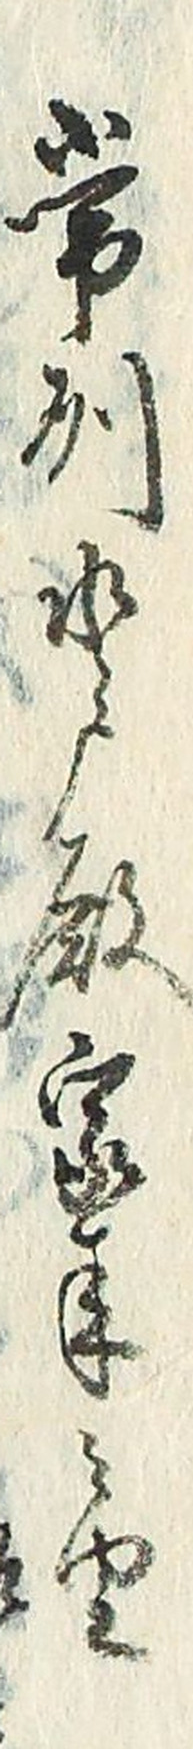常州水戸殿家来之由
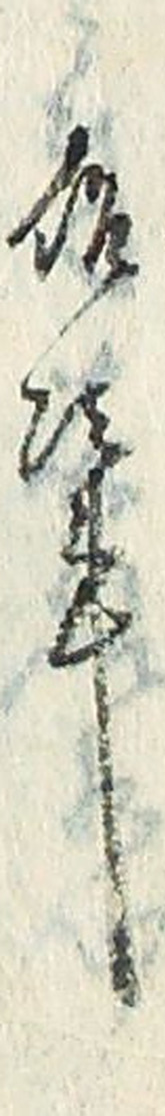作次事
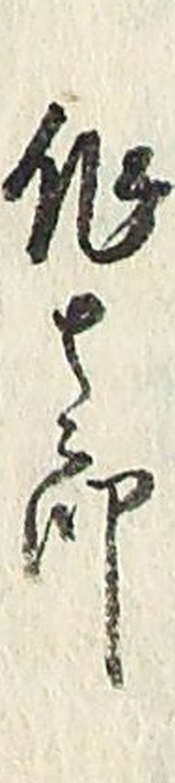作十郎
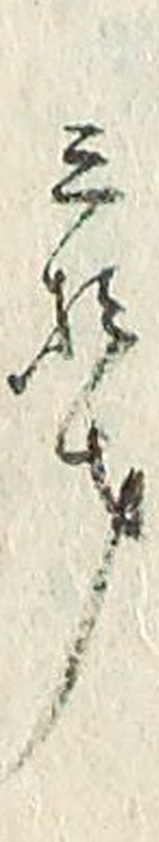三拾才
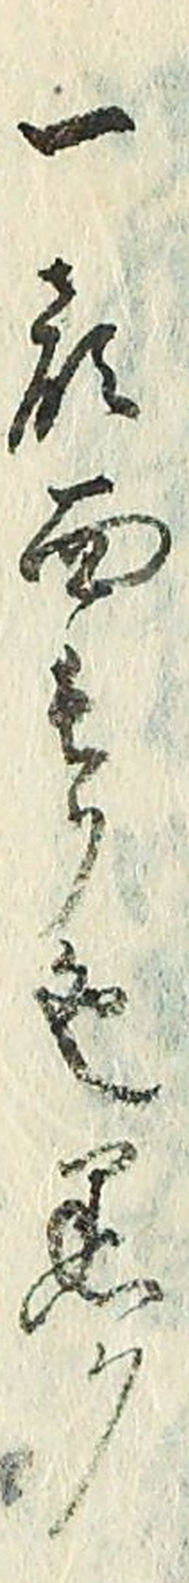一顔面長ク色黒ク
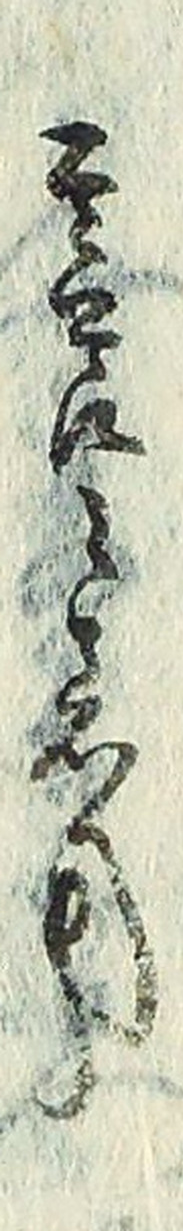其節之着用
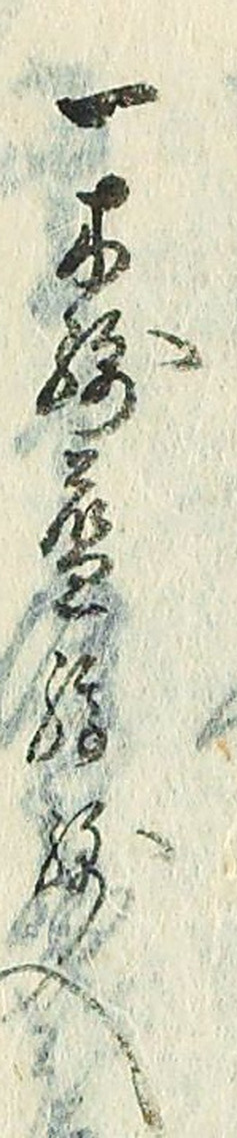一木綿藍縞綿入
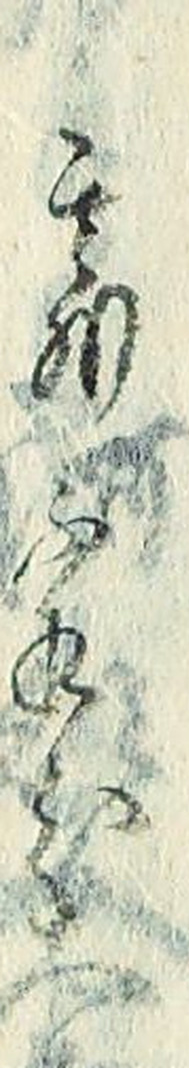其外不相分
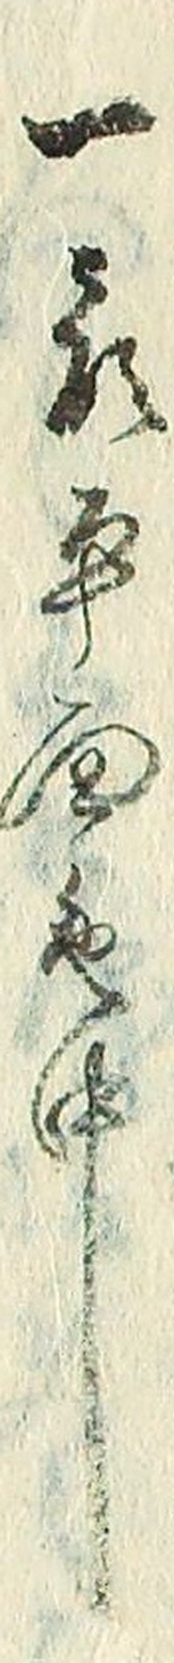一顔平面色中
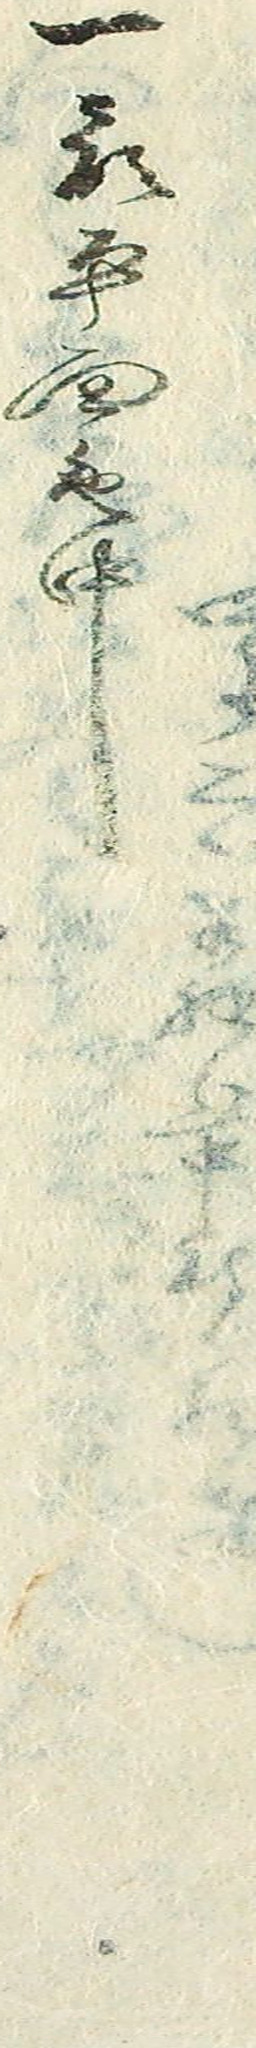一顔平面色中
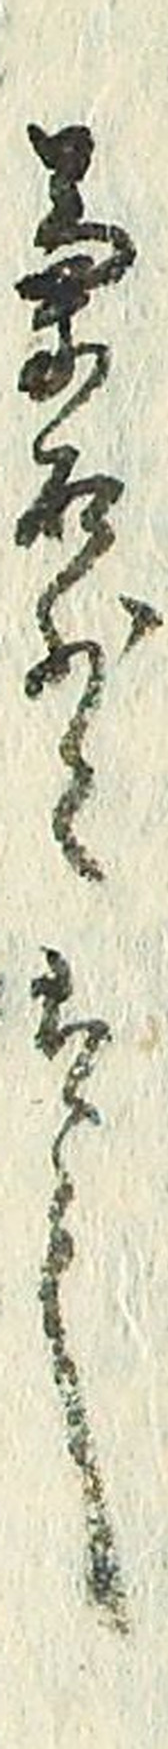菊石少々有之
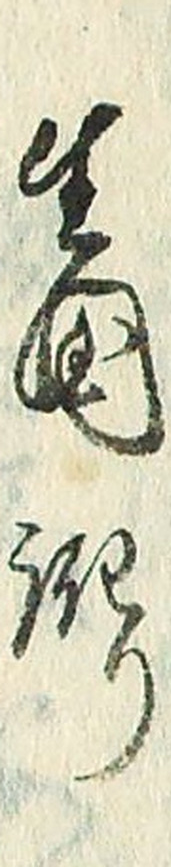生国訛り
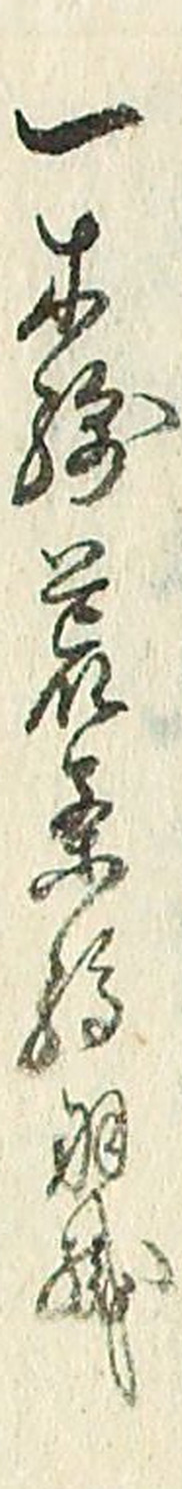一木綿荒茶縞羽織
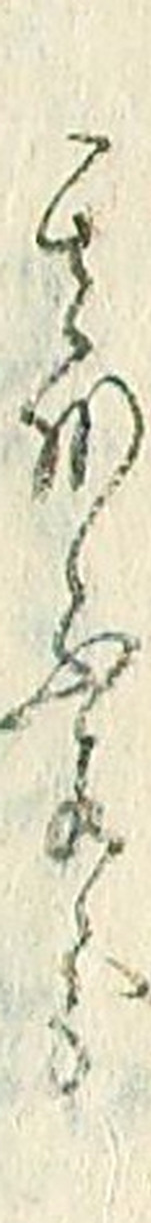其外不相分

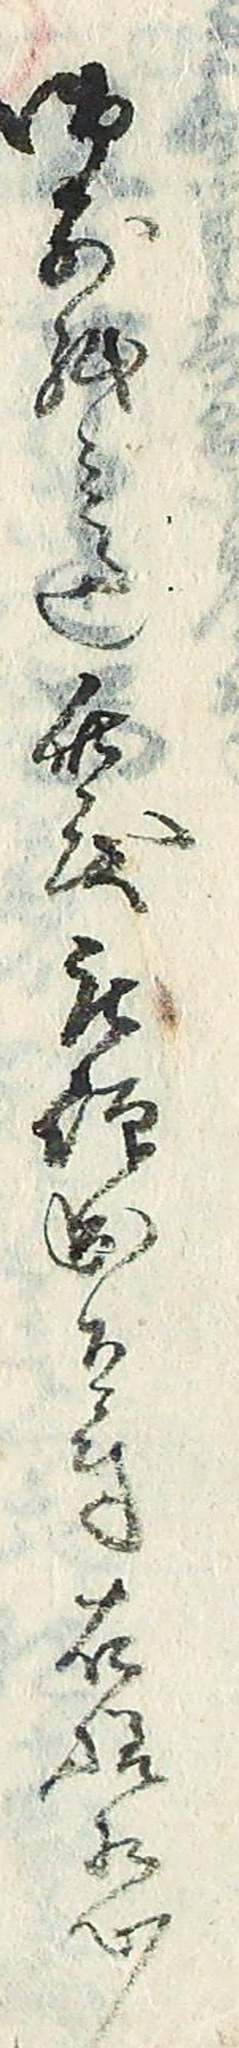御別紙之通此度被仰出候ニ付右様相心得
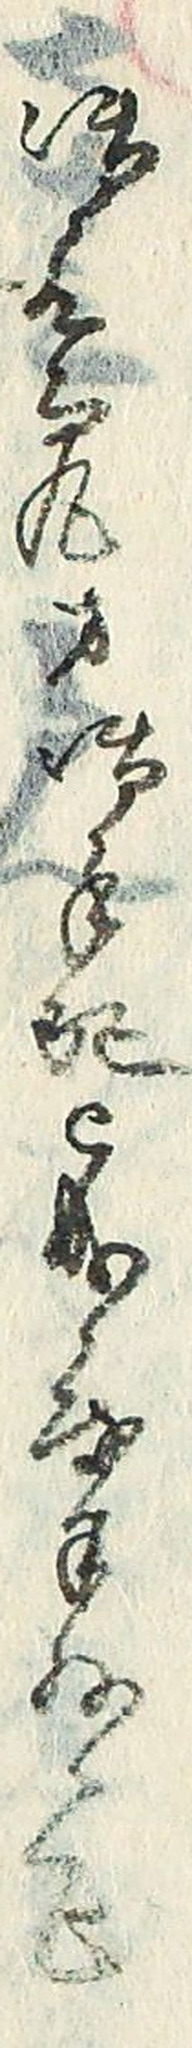御取究方御手配被成度奉存候以上
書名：諸御趣意書并御下知向之写
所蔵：鳴門教育大学 Naruto University of Education
